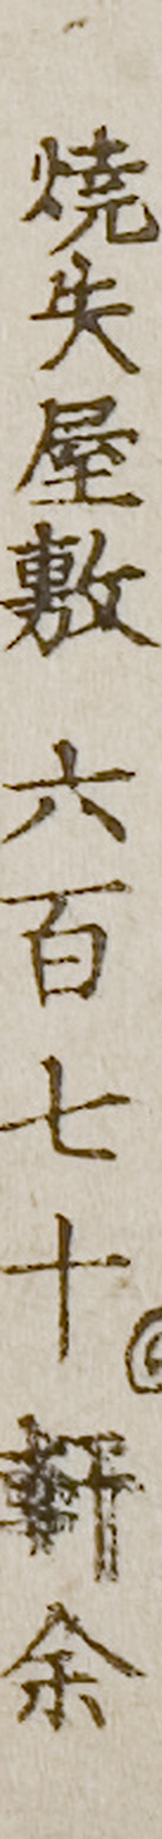焼失屋敷六百七十軒余
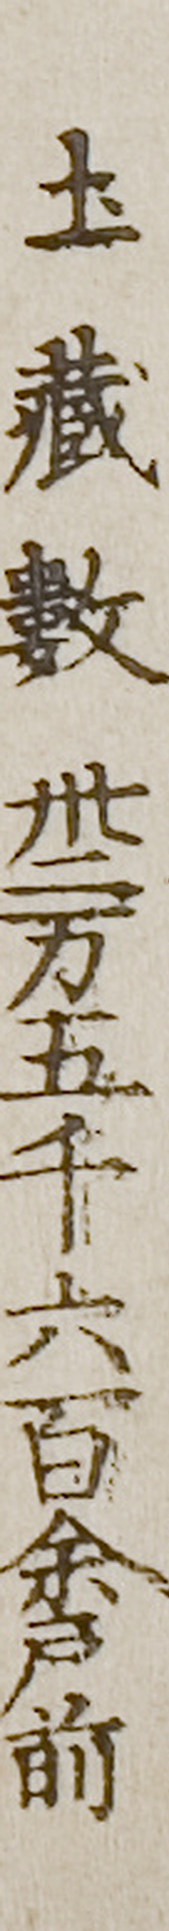土蔵数卅二万五千六百余戸前
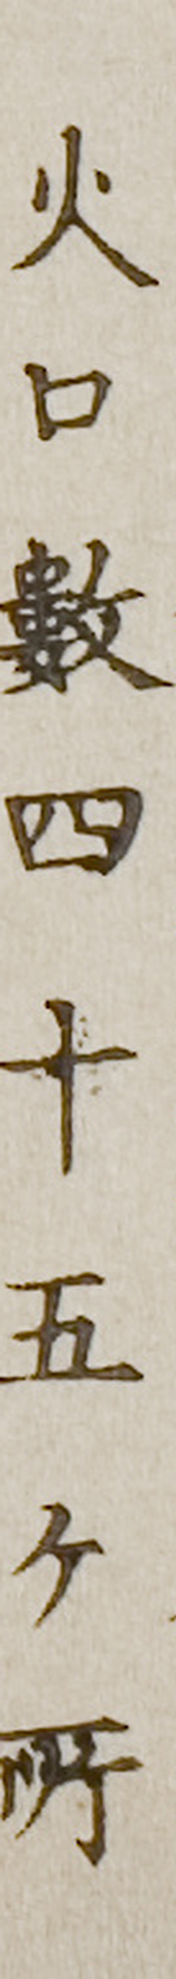火口数四十五ケ所
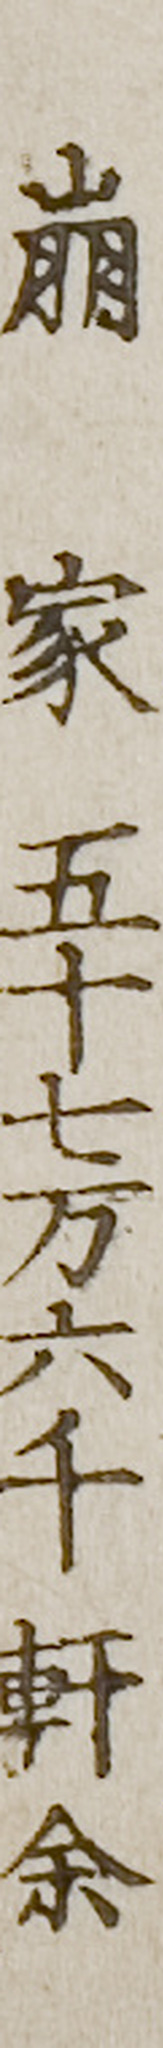崩家五十七万六千軒余
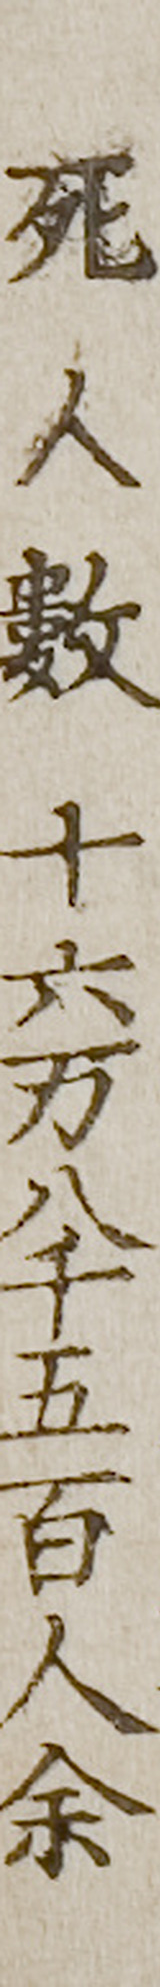死人数十六万八千五百人余
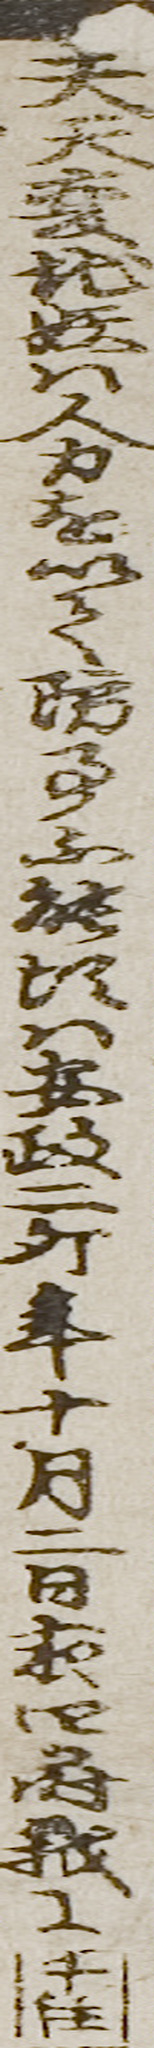夫天変地妖は人力を以て防事不能頃は安政二卯年十月二日夜四ツ時俄に
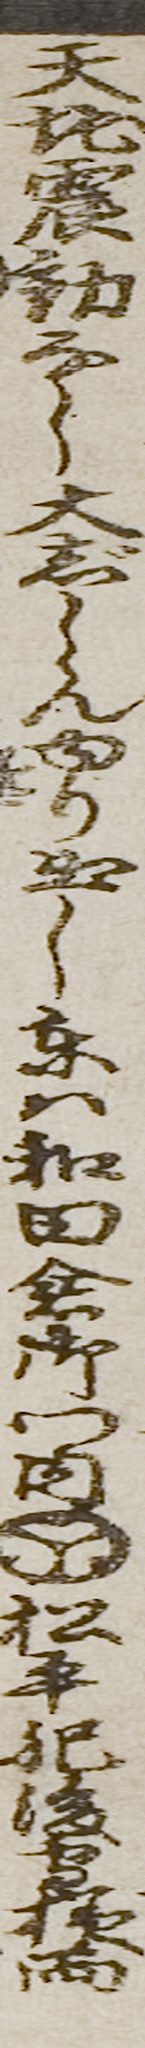天地震動なし大じしんゆり出し東は和田倉御門内〇松平肥後守様両
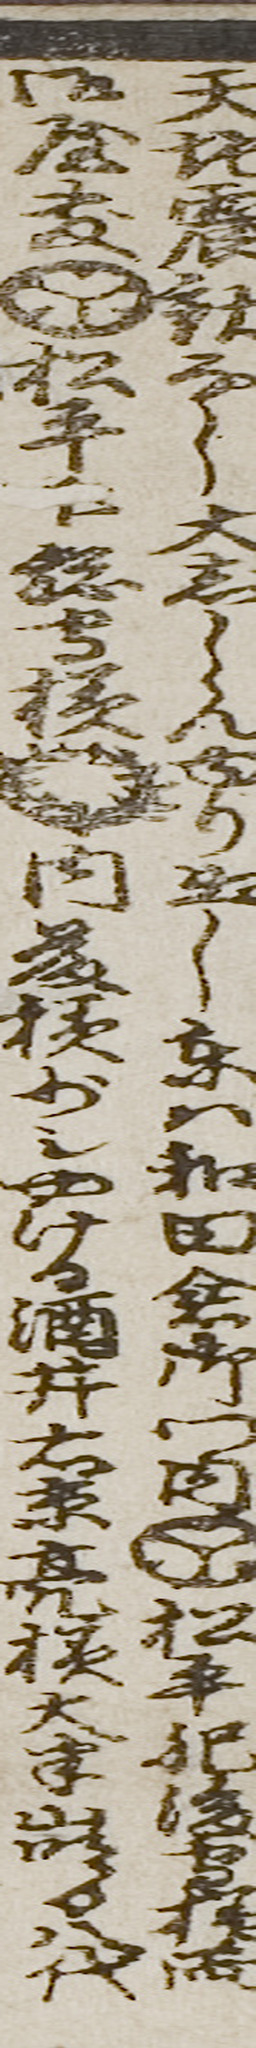御屋敷〇松平下総守様〇内藤様少シやける酒井右京亮様大半崩る八代
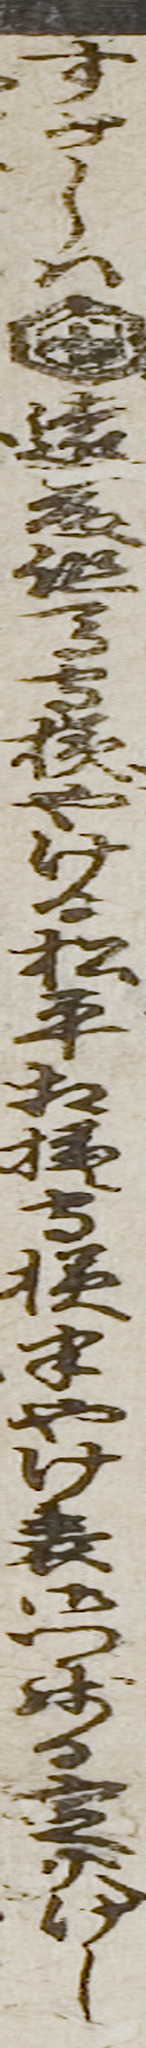すがしは〇遠藤但馬守様やける松平相模守様半やけ表御門残る定火けし
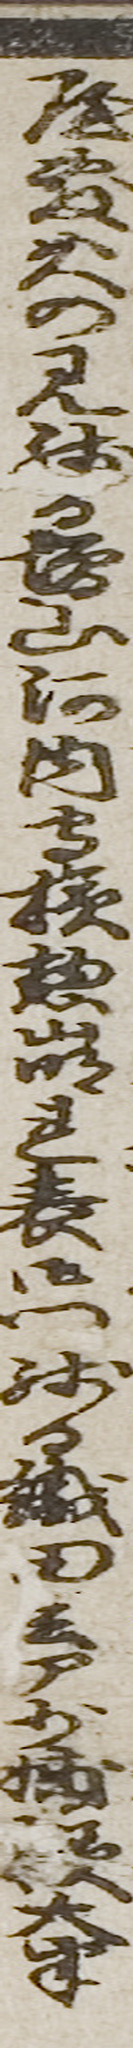屋敷火の見残る増山河内守様惣崩れ表御門残る織田兵部少輔様大半
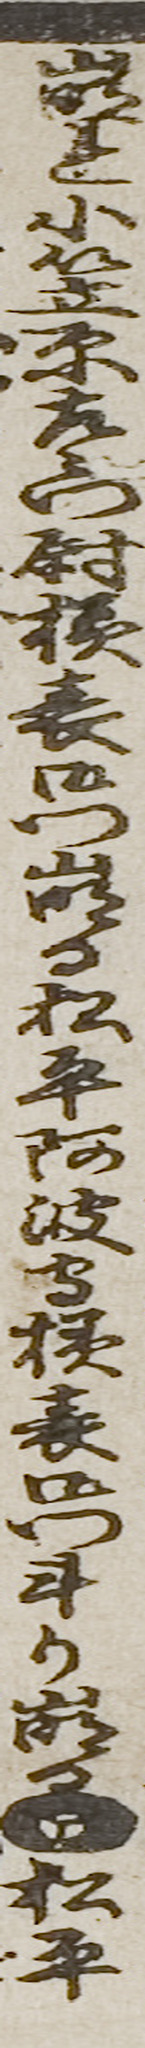崩れ小笠原左衛門尉様表御門崩る松平阿波守様表御門斗り崩る〇松平
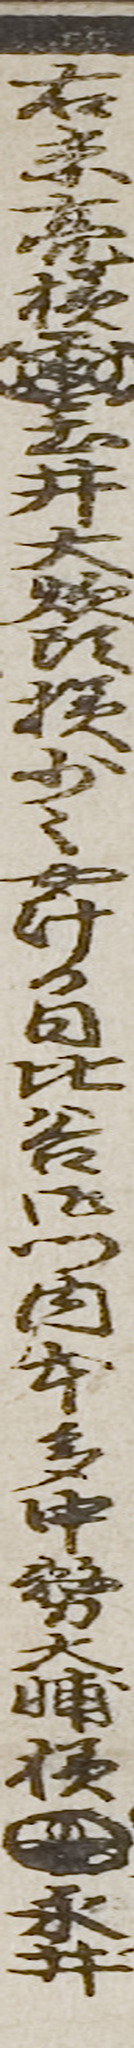右京亮様〇土井大炊頭様少々やける日比谷御門内本多中務大輔様〇永井
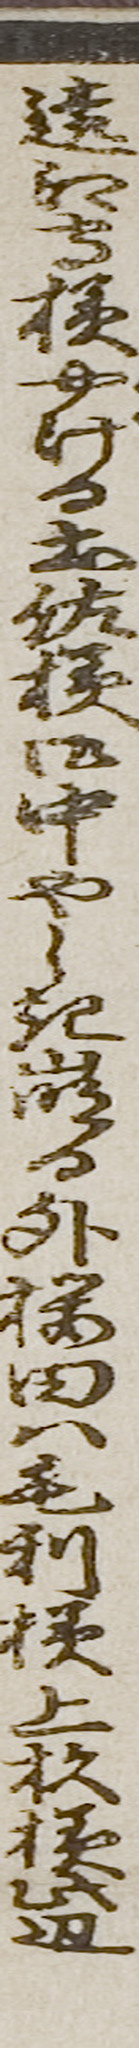遠江守様やける土佐様御中やしき崩る外桜田は毛利様上杉様此辺
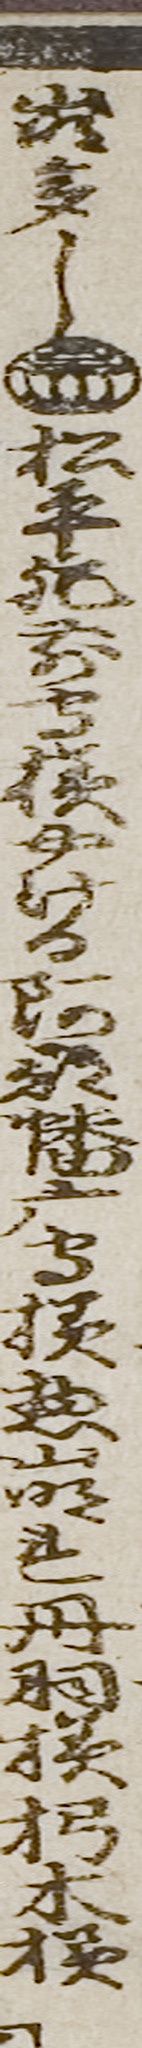崩多し〇松平肥前守様やける阿部播磨守様惣崩れ丹羽様朽木様
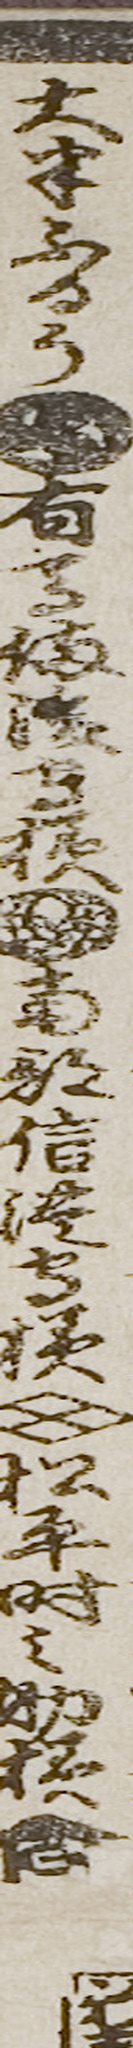大半ふるう〇有馬備後守様〇南部信濃守様〇松平時之助様〇
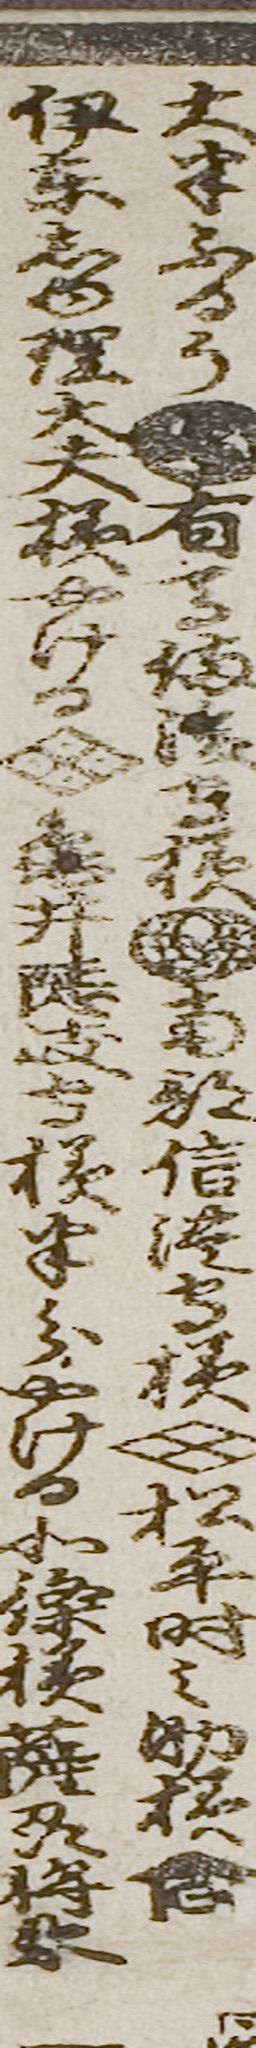伊東しゆ理大夫様やける〇亀井隠岐守様半分やける北條様薩州将束
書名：安政改正泰平盤石図会
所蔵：東京大学総合図書館 General Library in the University of Tokyo, JAPAN
